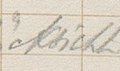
auf seine
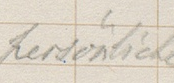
Freundschaft
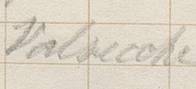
Valsecchi.
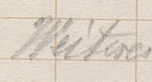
Weiteres
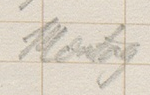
Montag
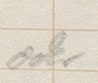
oder
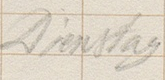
Dienstag.
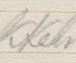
meine
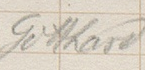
Gotthard
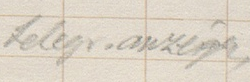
telegr. anzeigen,
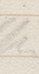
G.
